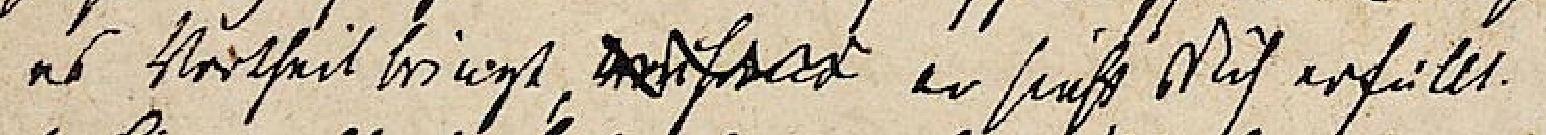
es Vortheil bringt, während er sieht Dich erfüllt.
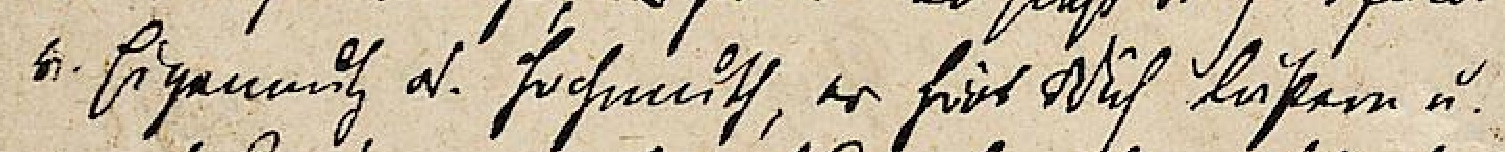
v Eigennutz od. Hochmuth, er hört Dich lästern u.
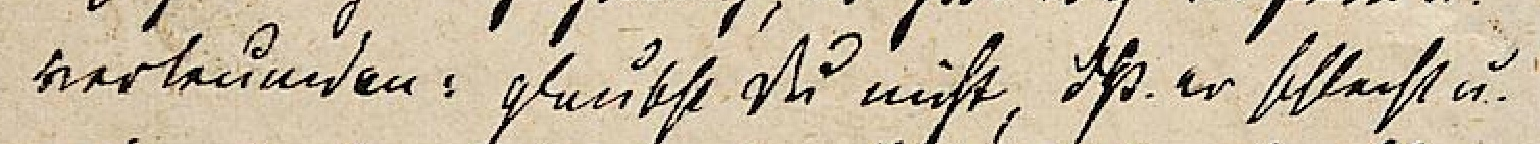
verleumden: glaubst Du nicht, daß er schlecht u.
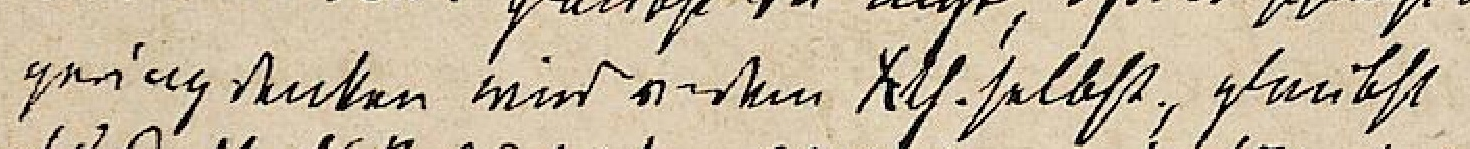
gering denken wird v. dem Χth. selbst., glaubst
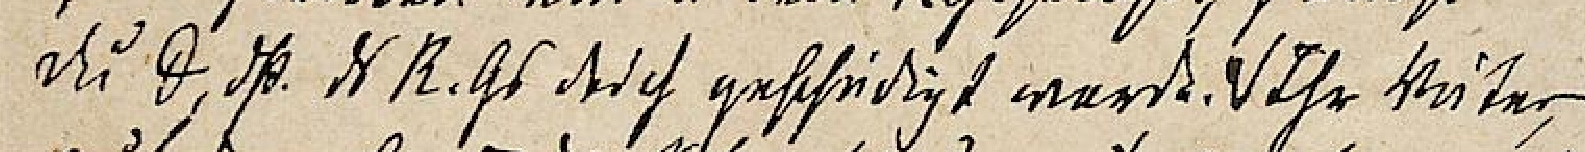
Du o, dß das R. Gs dadch geschädigt werde. V Ihr Väter,
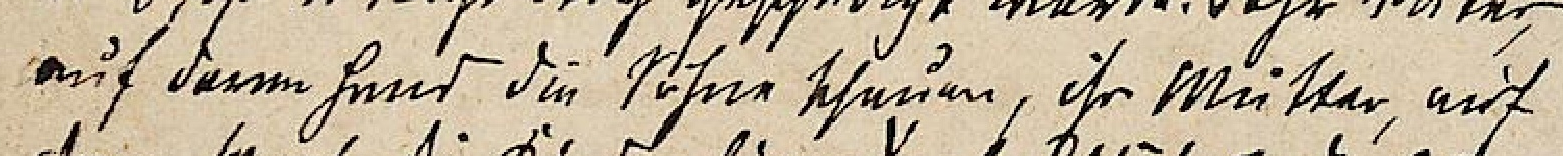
auf deren Hand die Söhne schauen, ihr Mütter auf
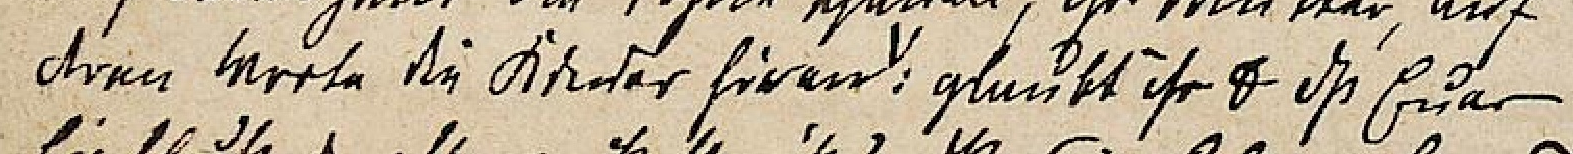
deren Worte die Kinder hören: glaubt ihr o dß Euer
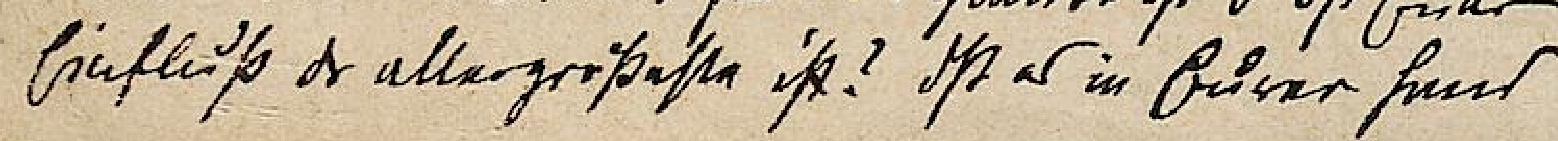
Einfluß dr allergrößeste ist? Dß es in Eurer Hand
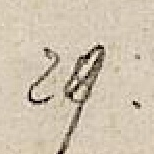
29
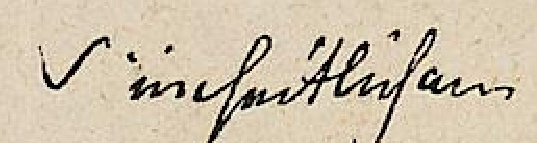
V einheitlichen.
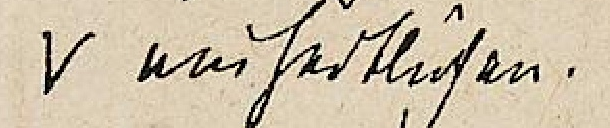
V einheitlichen.
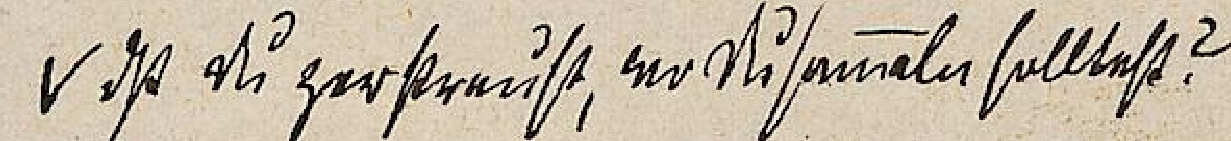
V dß Du zerstreust, wo du sameln solltest?
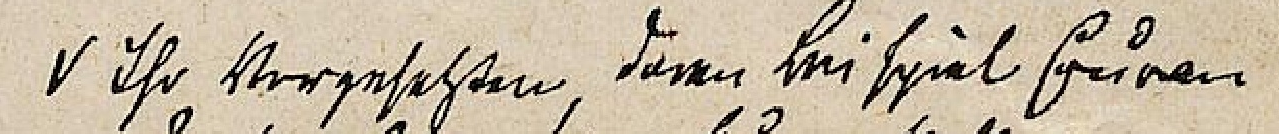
V ihr Vorgesetzten, deren Beispiel Euren
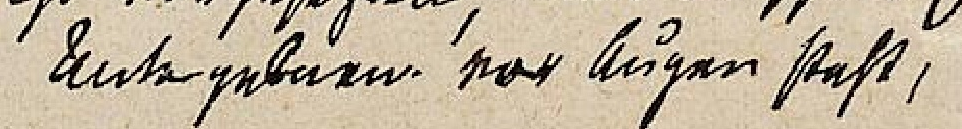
Untergebnen vor Augen steht
